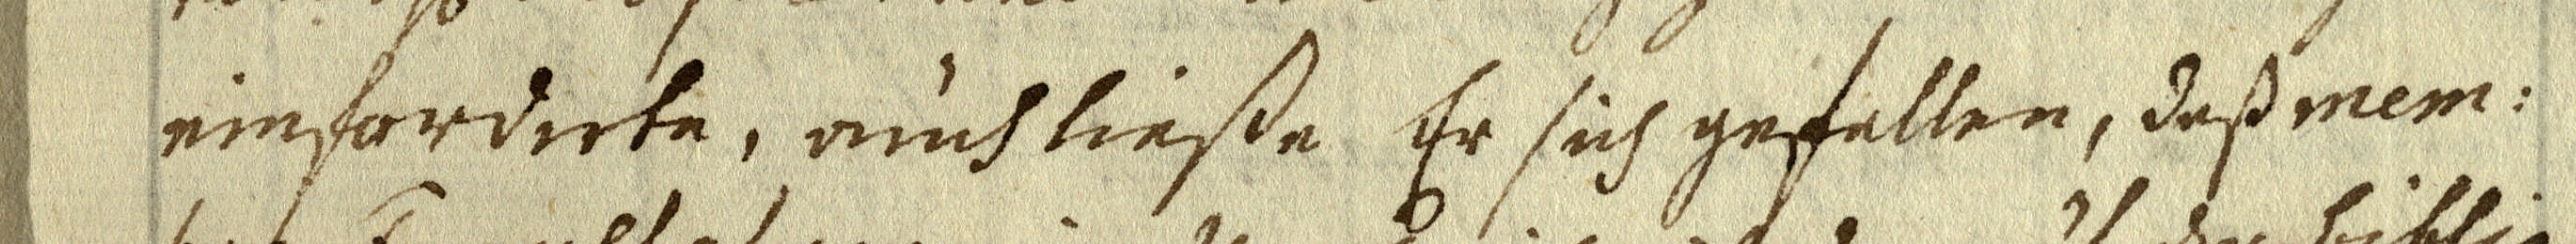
einforderte, auch ließe Er sich gefallen, daß mem¬
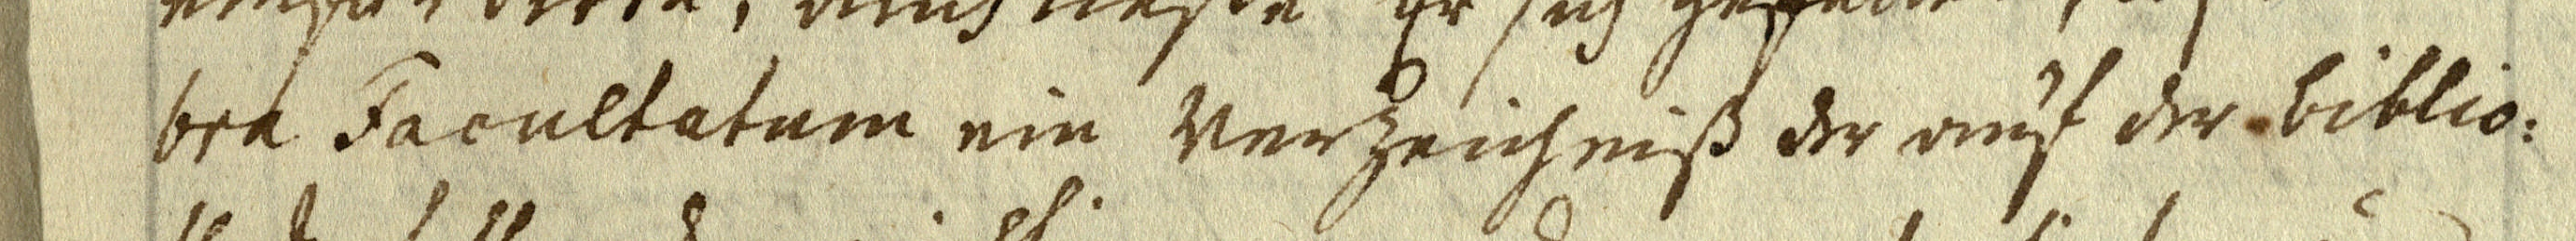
bra Facultatum ein Verzeichniß der auf der biblio¬
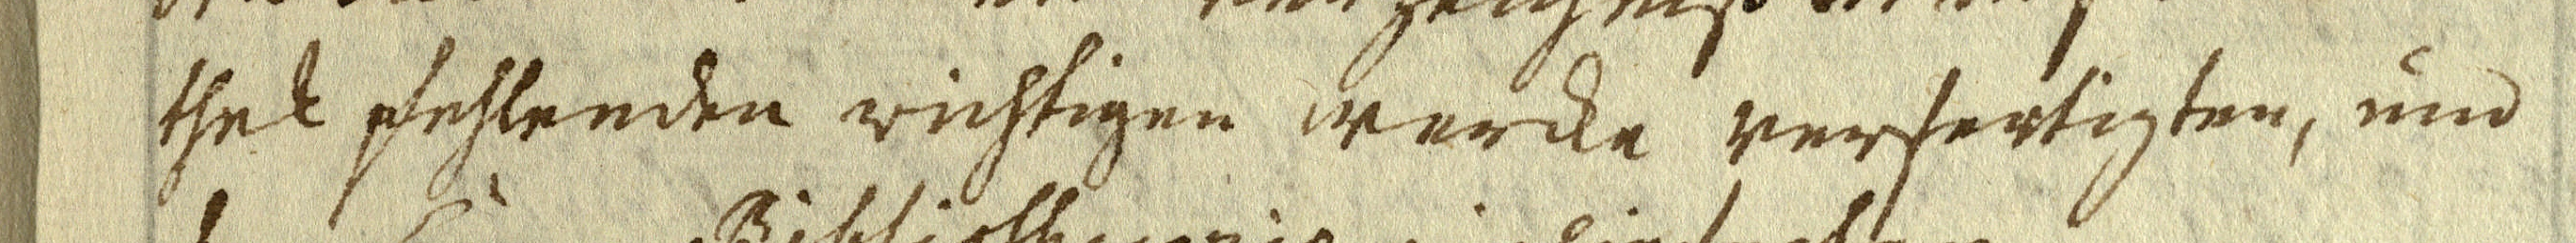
thek fehlenden wichtigen wercke verfertigten, und
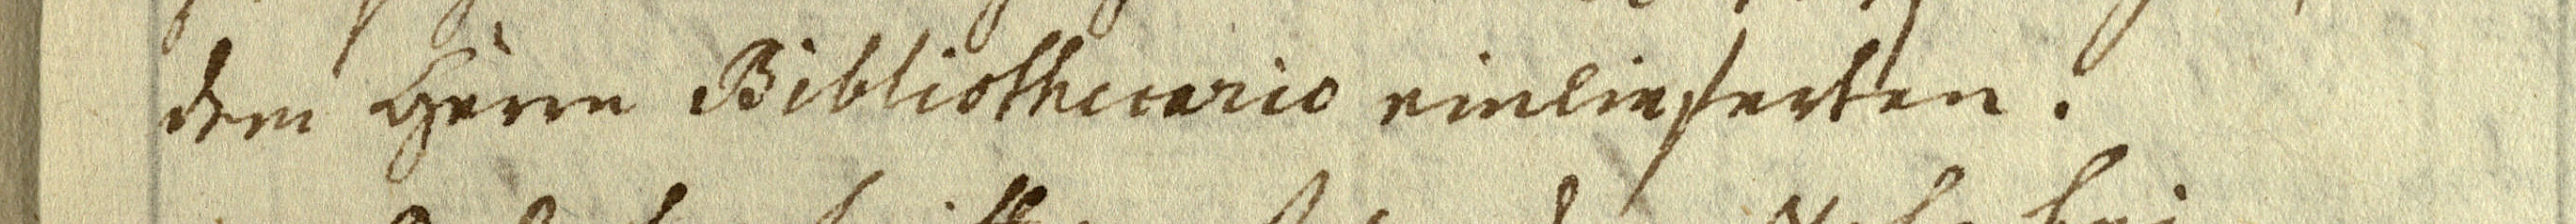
dem Herrn Bibliothecario einlieferten.
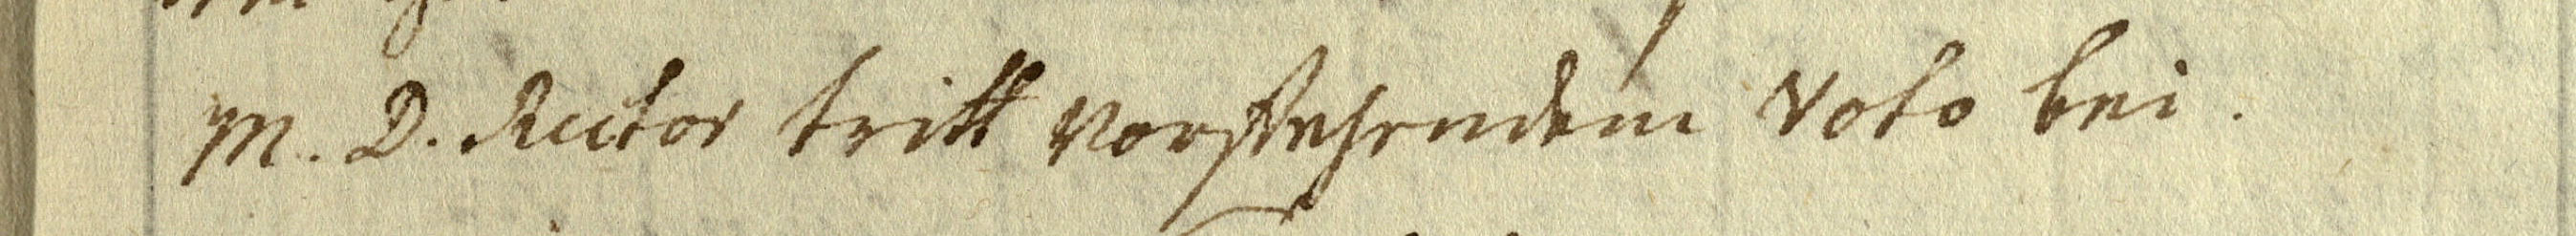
M. D. Rector tritt vorstehendem Voto bei.
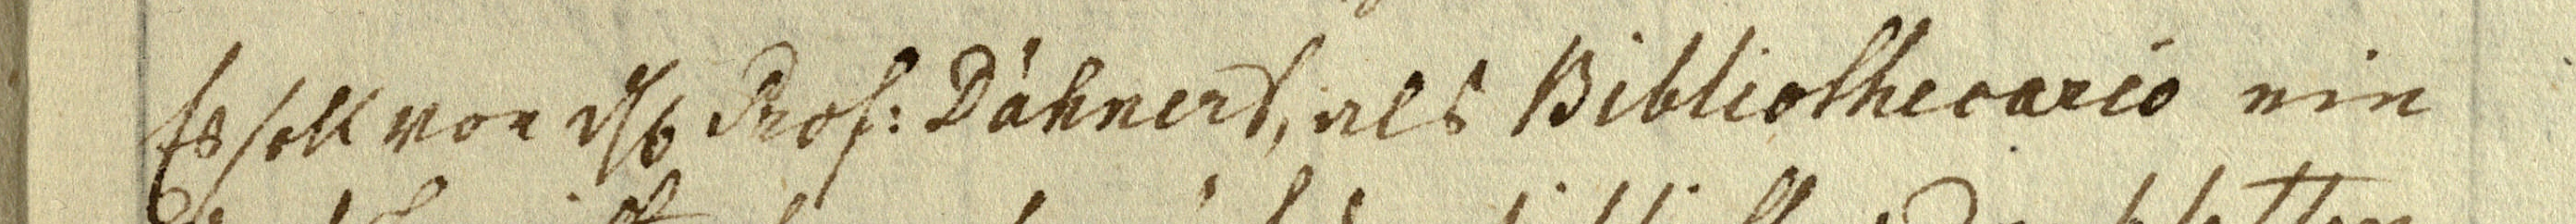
Es soll von dh Prof. Dähnert, als Bibliothecario ein
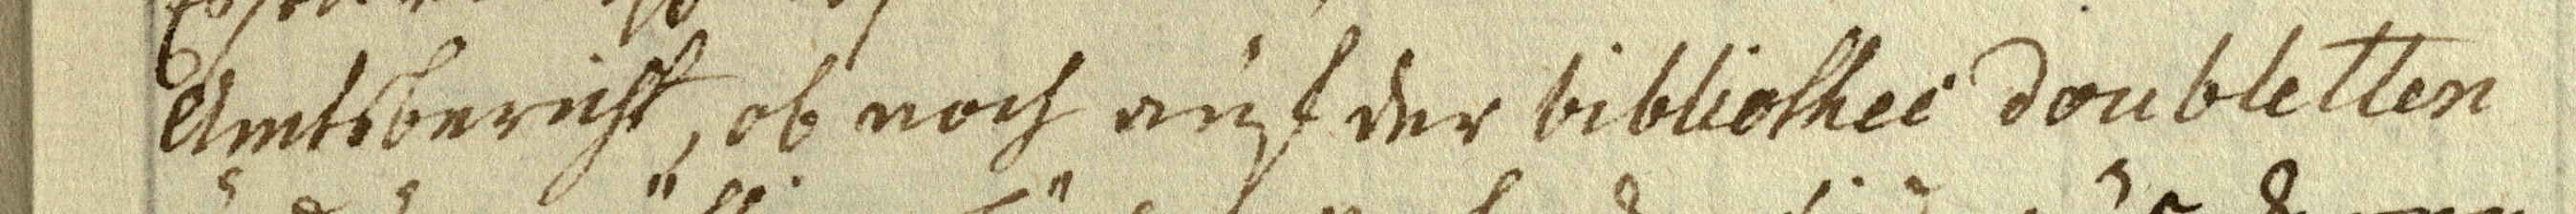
Amtsbericht, ob noch auf der bibliothek doubletten
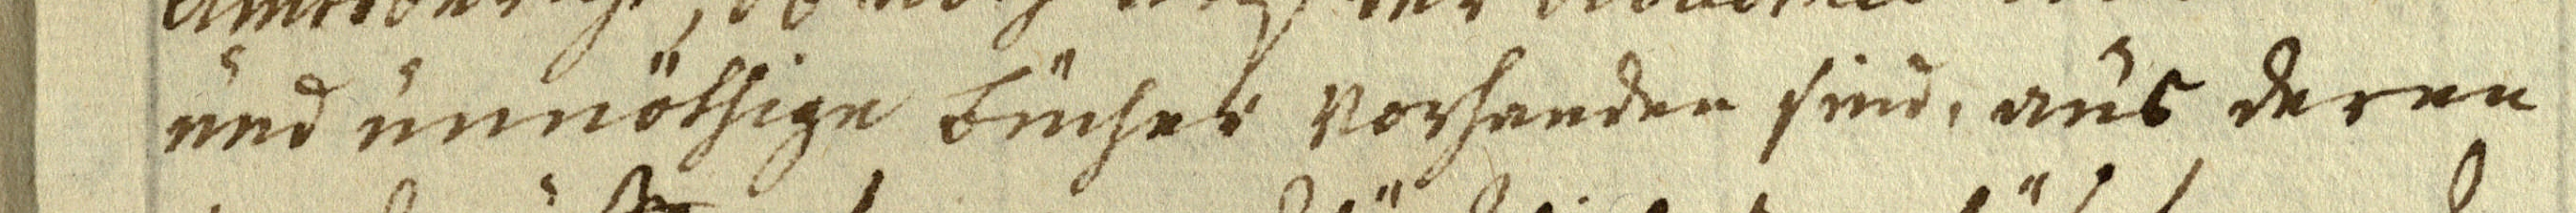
und unnöthige Bücher vorhanden sind, aus deren
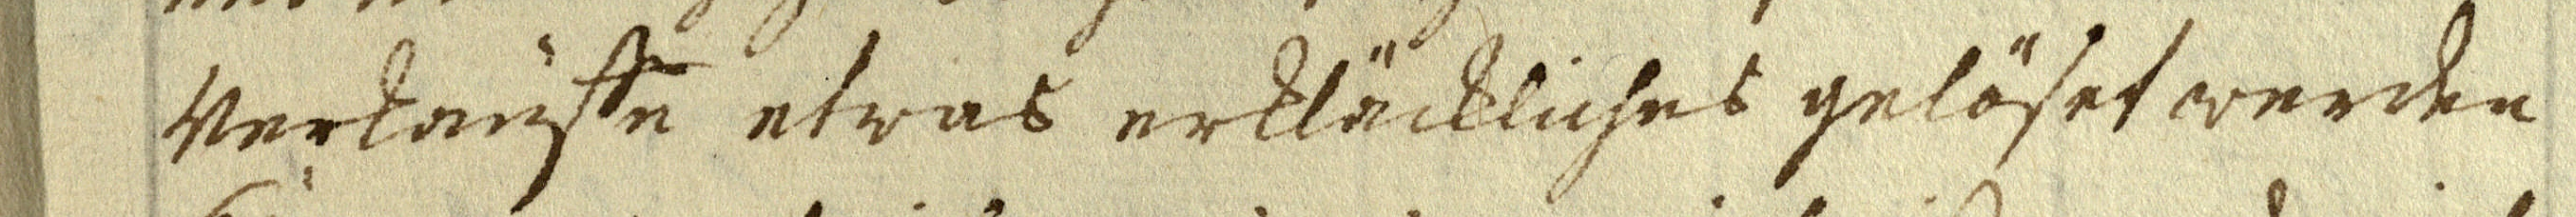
Verkäufe etwas erkläckliches gelöset werden
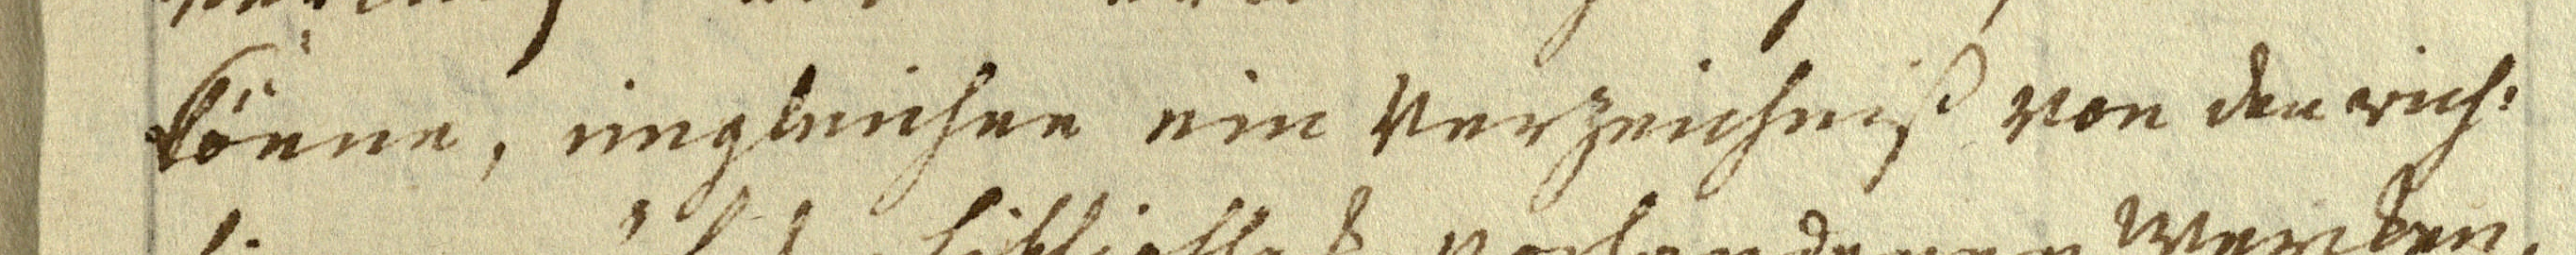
könne, imgleichen ein Verzeichniß von den wich¬
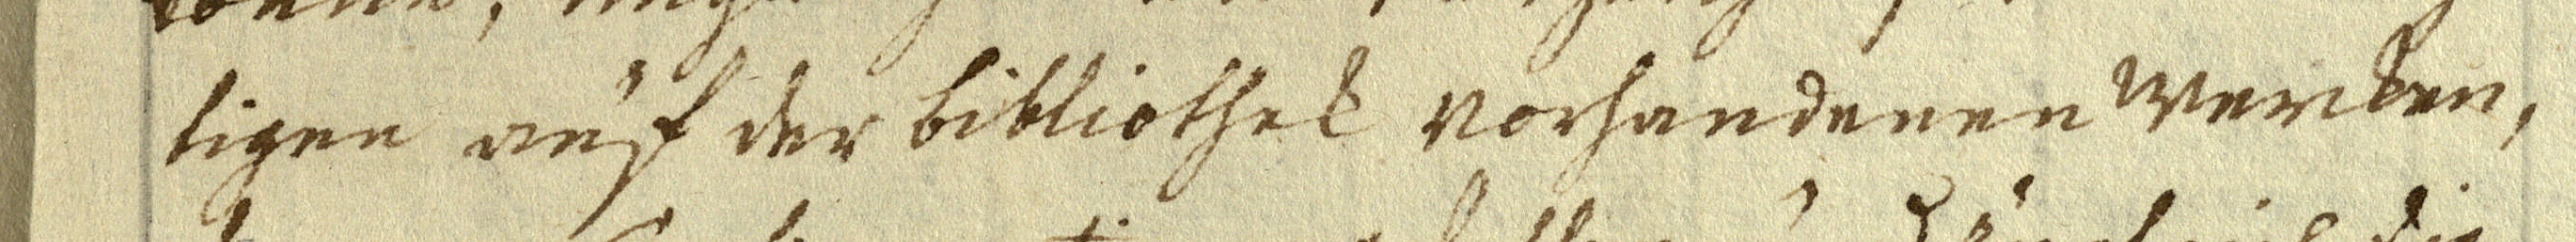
tigen auf der Bibliothek vorhandenen Wercken,
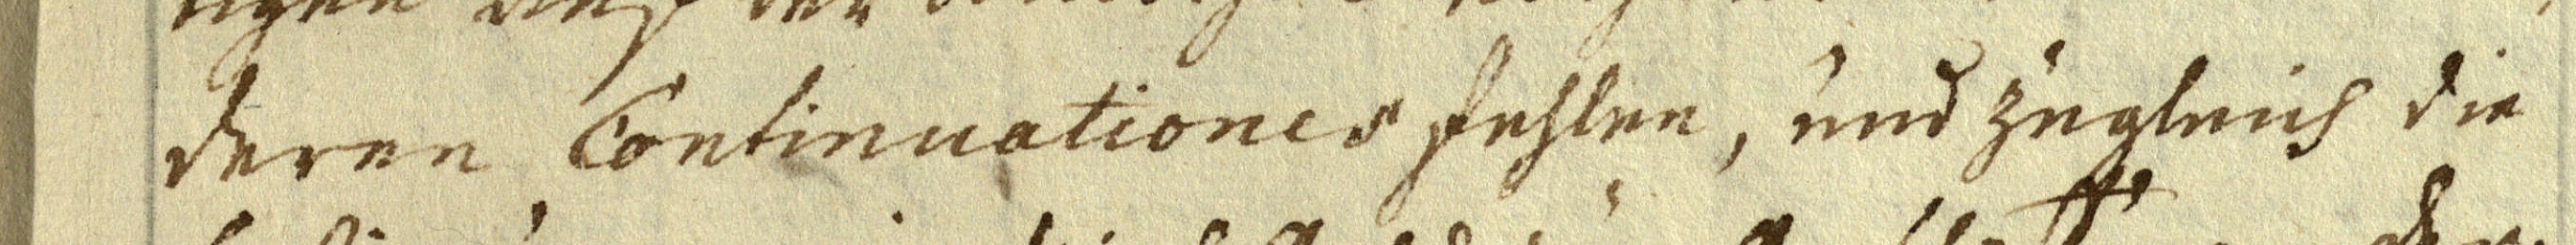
deren Continuationes fehlen, und zugleich die
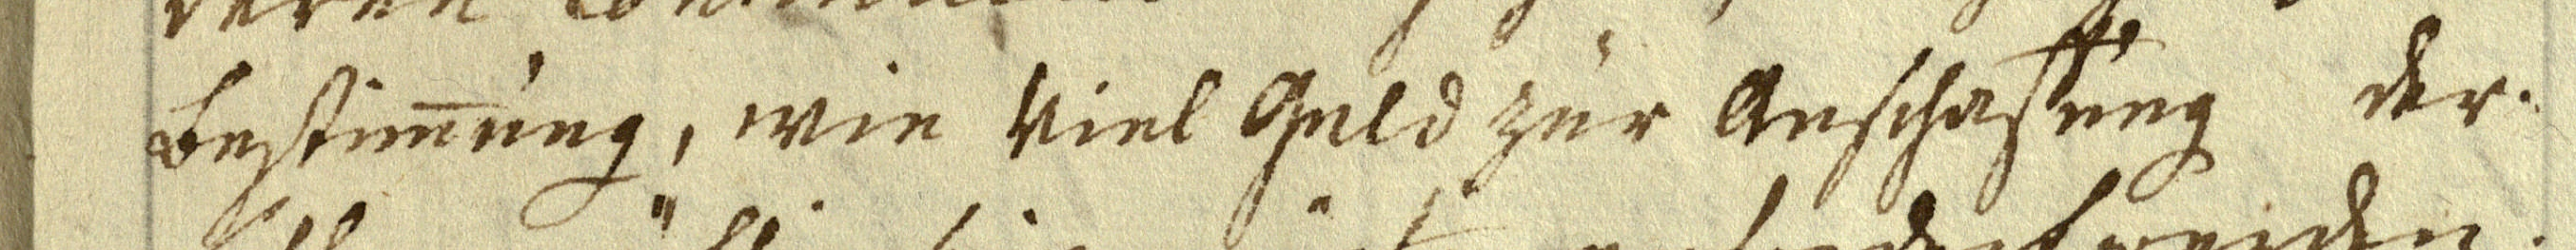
Bestimung, wie viel Geld zur Anschaffung der¬
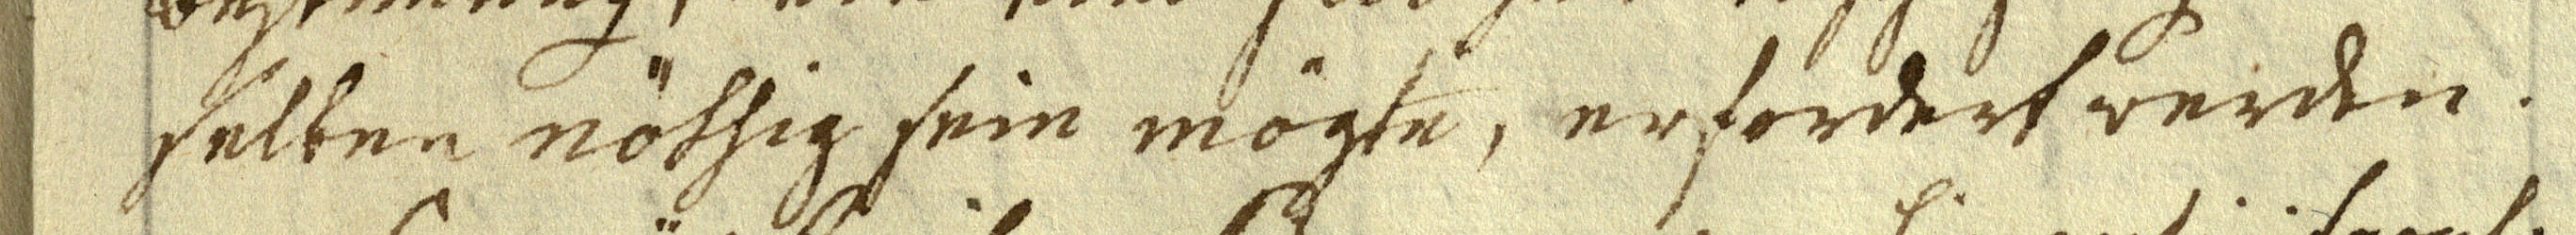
selben nöthig sein mögte, erfordert werden.
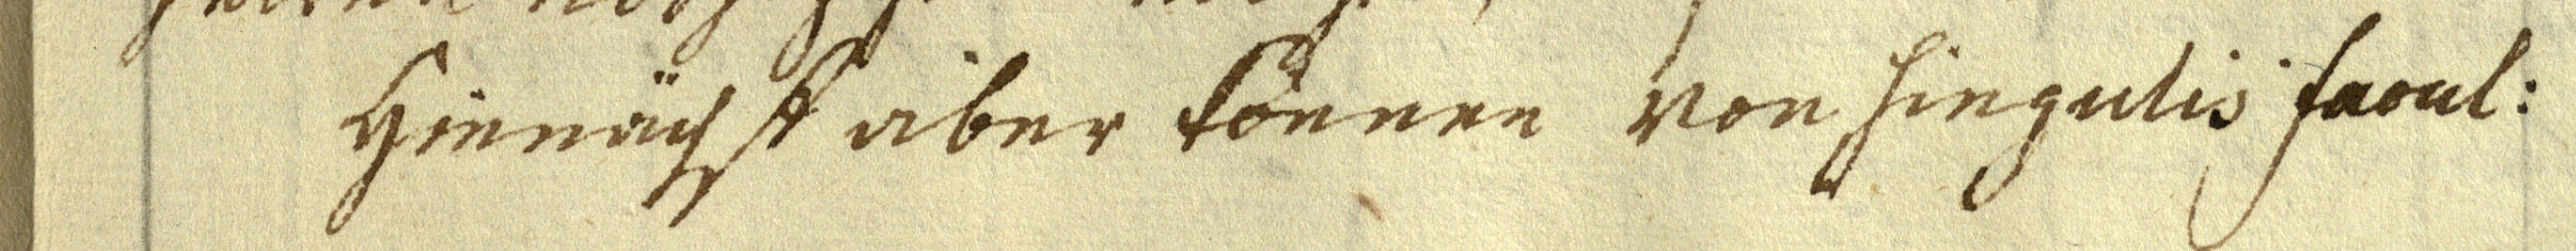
Hienächst aber können von singulis Facul¬
